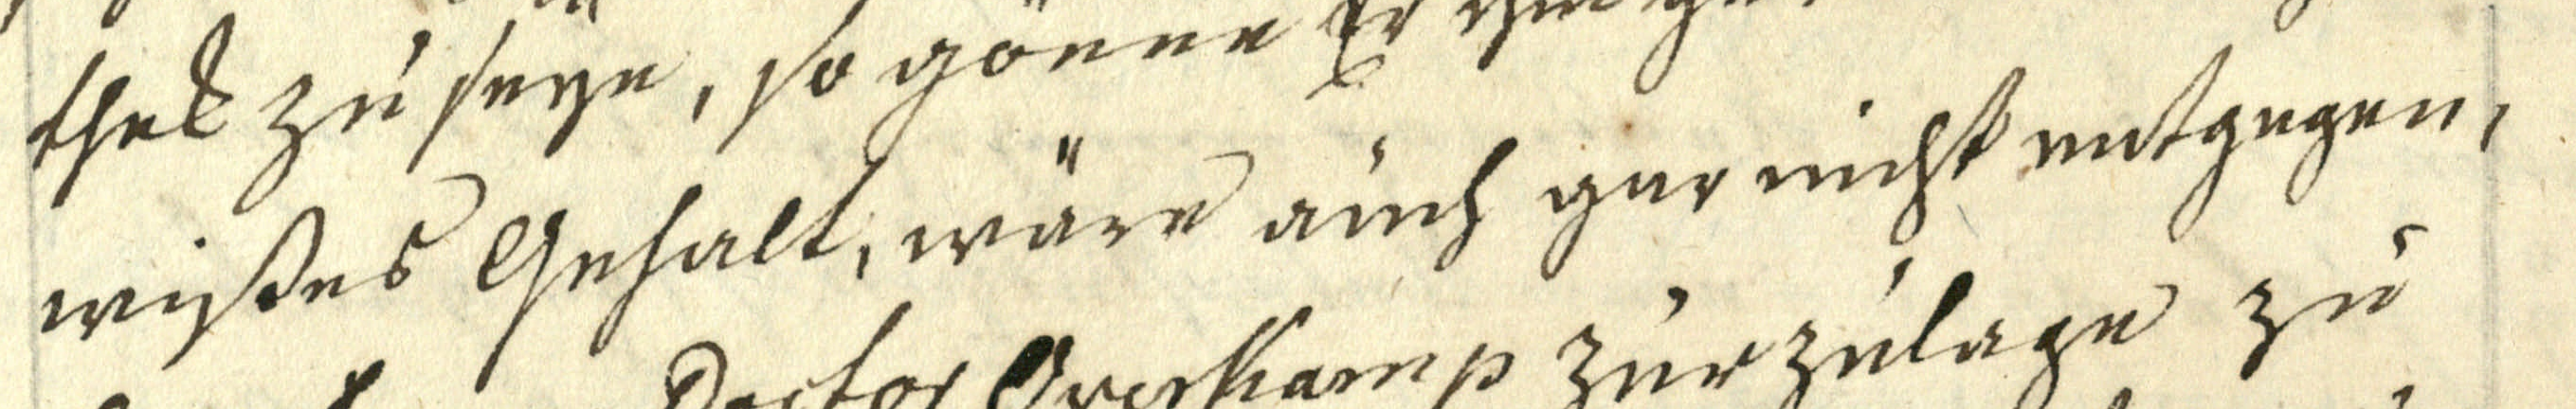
wißes Gehalt, wäre auch gar nicht entgegen,
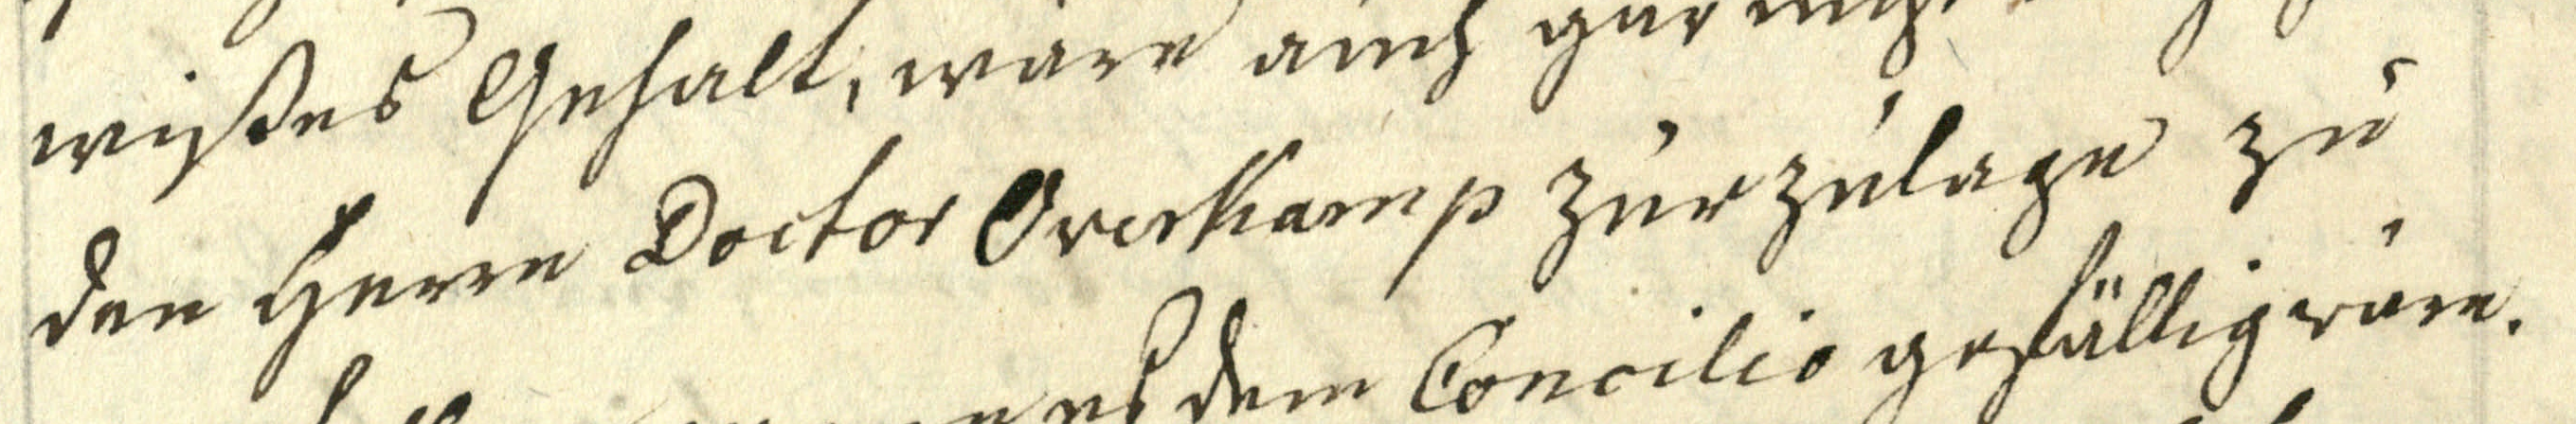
den Herrn Doctor Overkamp zur Zulage zu
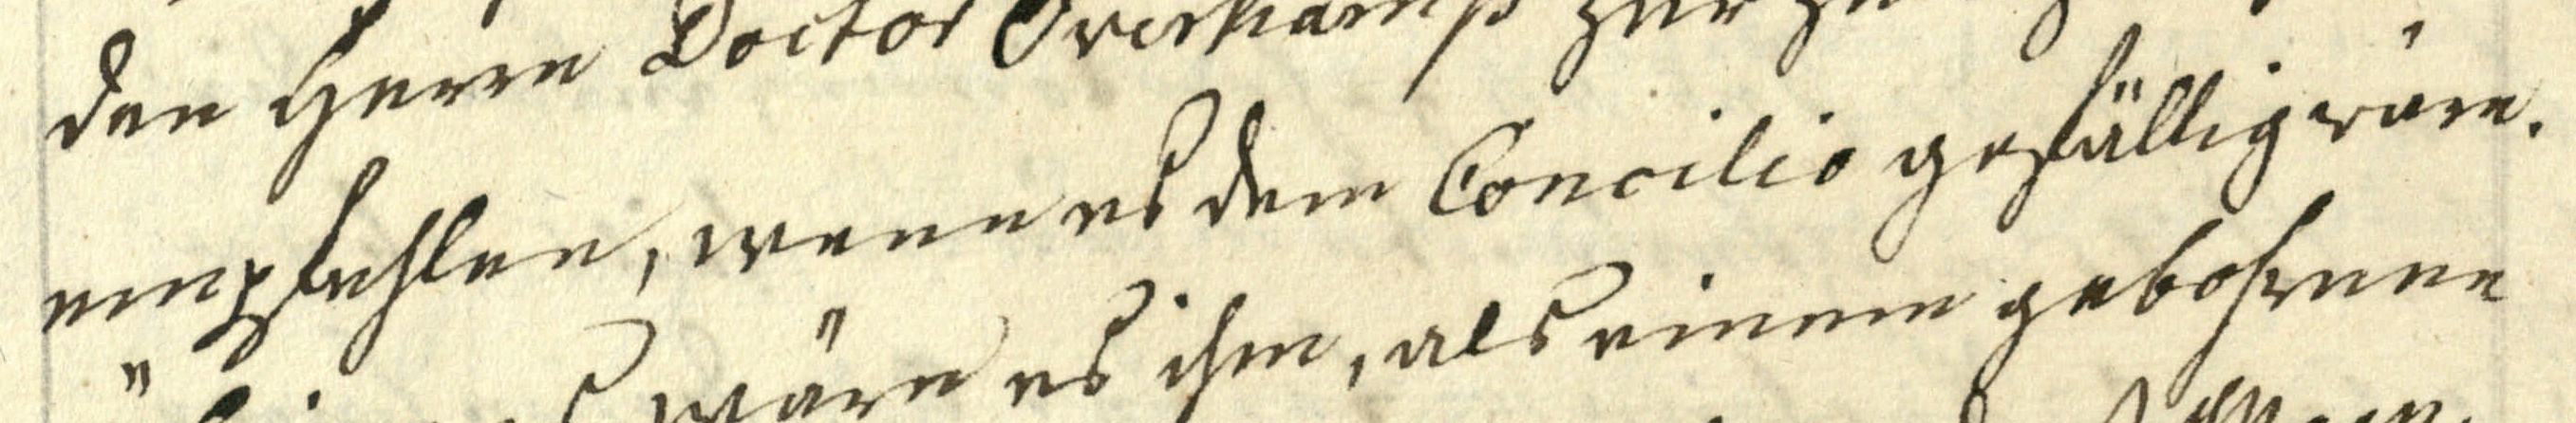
empfehlen, wenn es dem Concilio gefällig wäre.
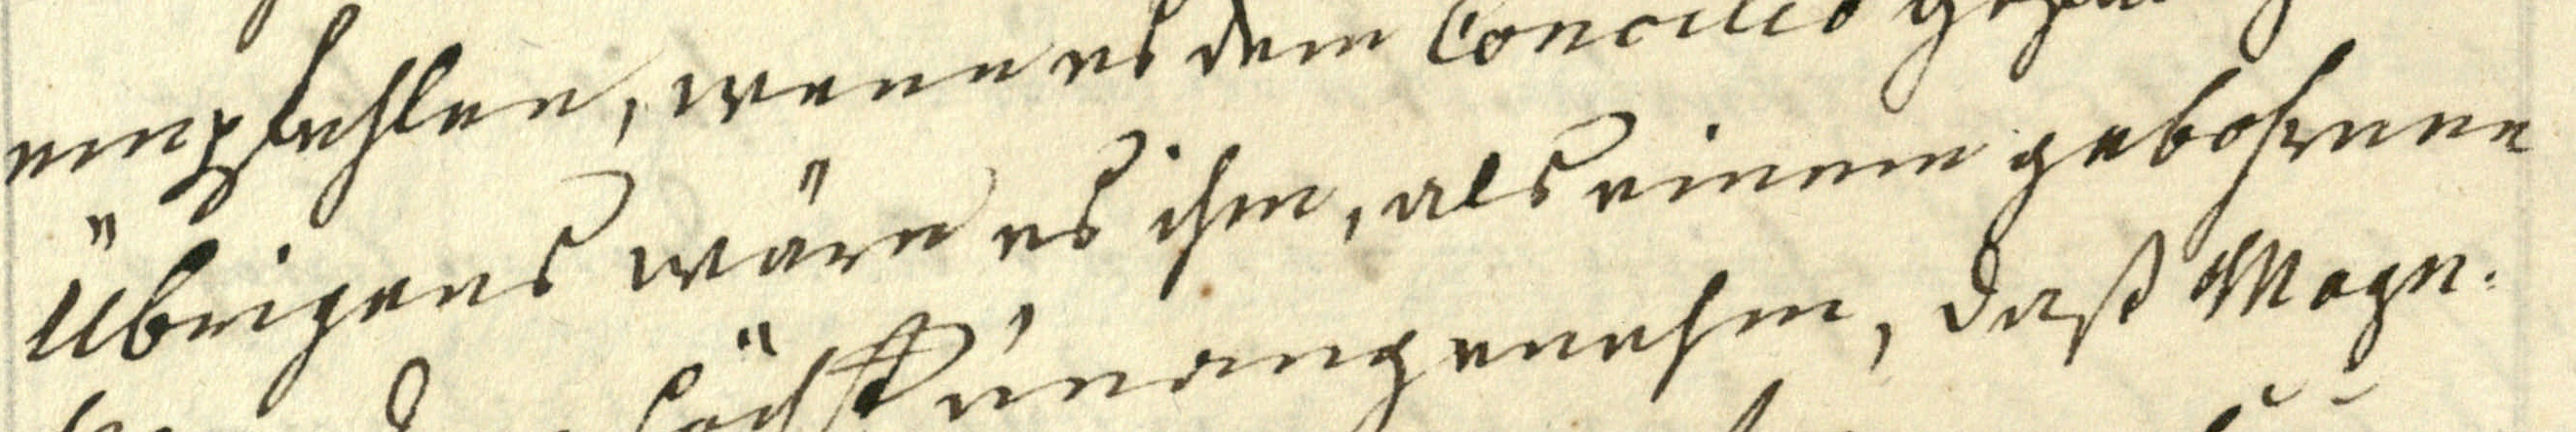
Übrigens wäre es ihm, als einem gebohrnen
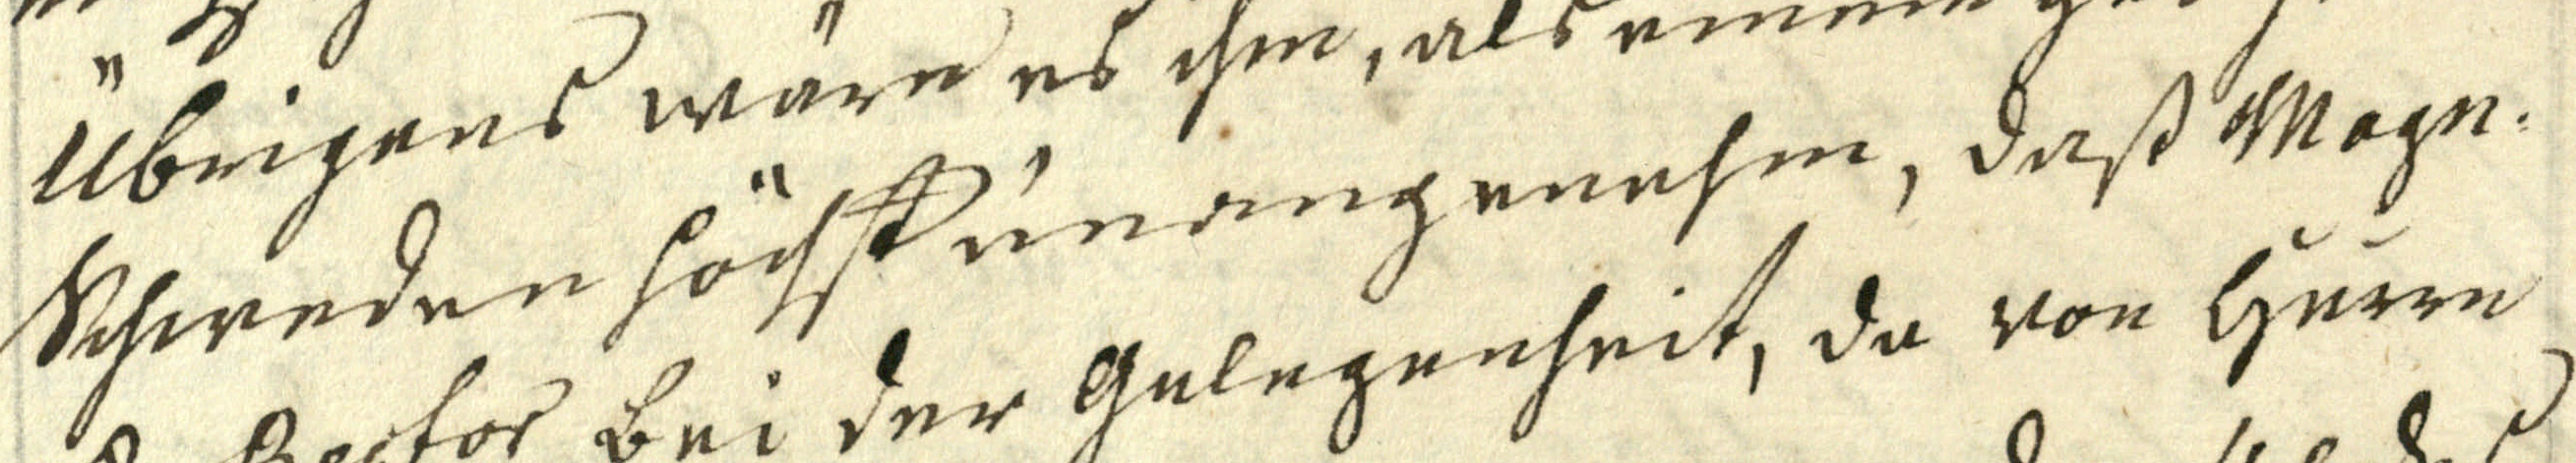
Schweden höchst unangenehm, daß Magn.
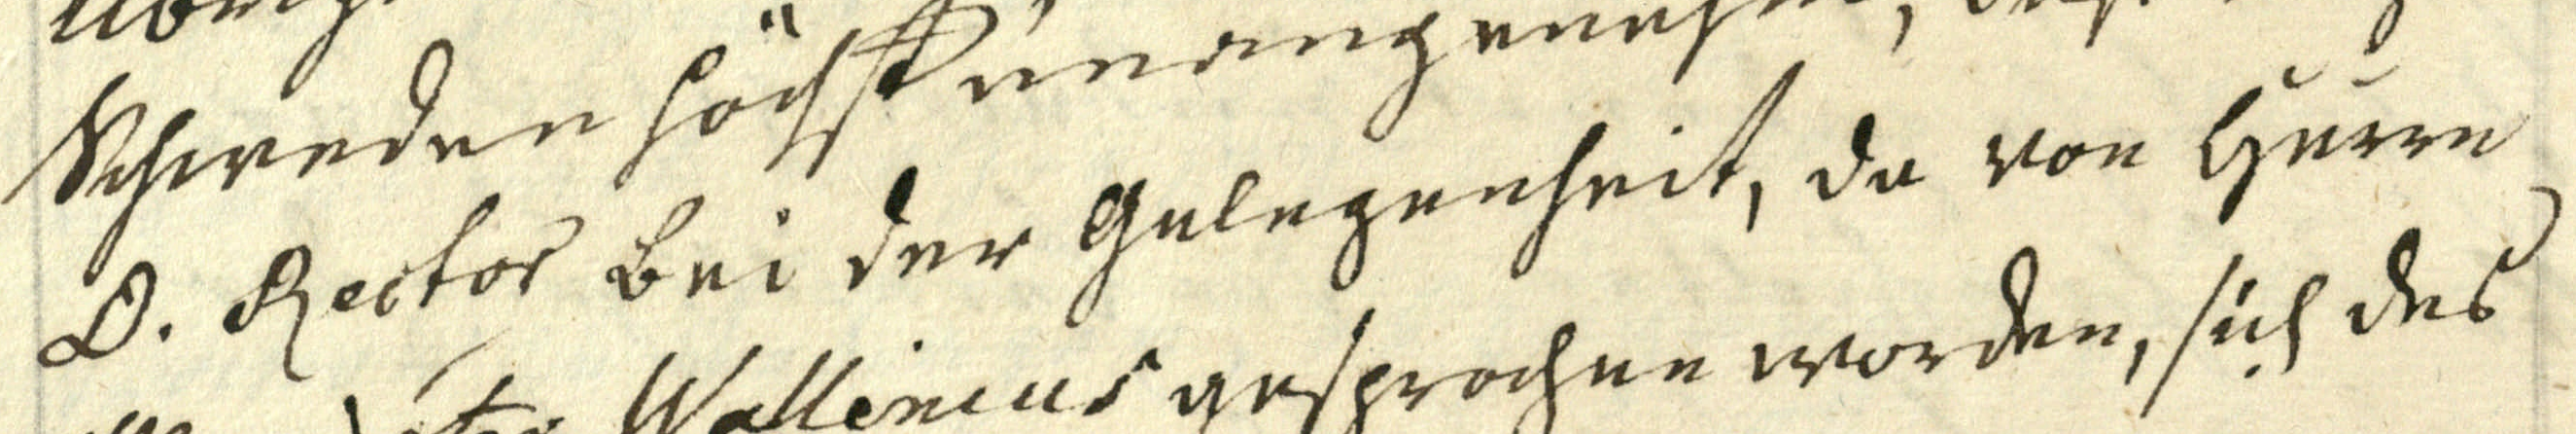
D. Rector bei der Gelegenheit, da von Herrn
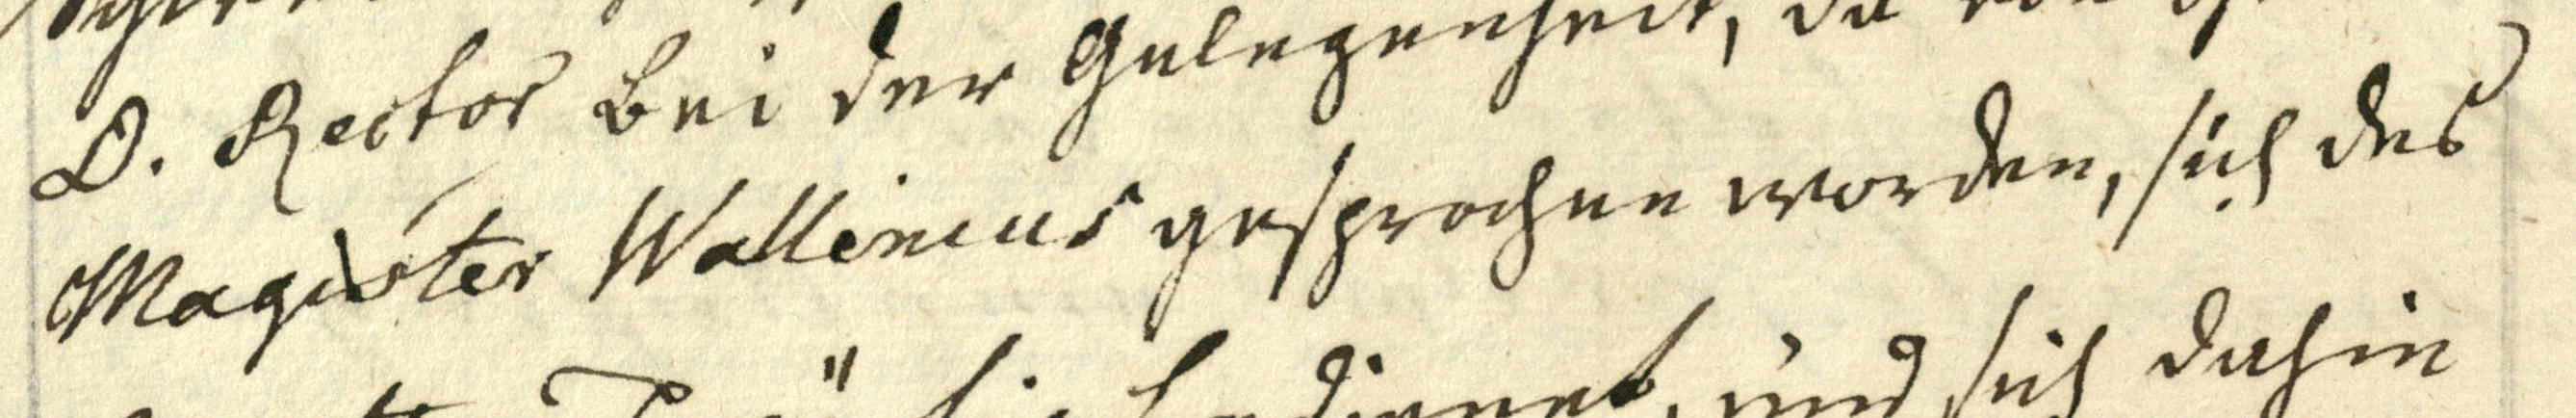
Magister Wallenius gesprochen worden, sich des
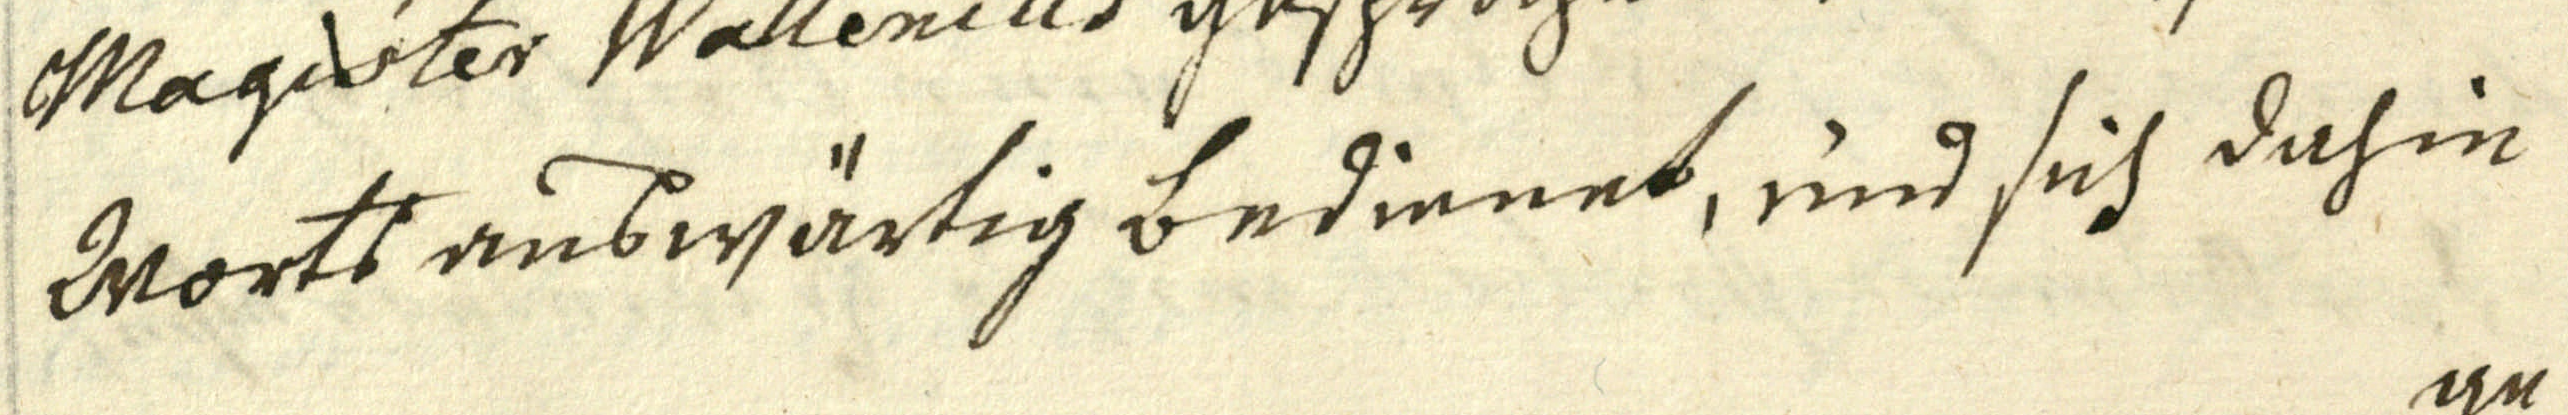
Worts auswärtig bedienet, und sich dahin
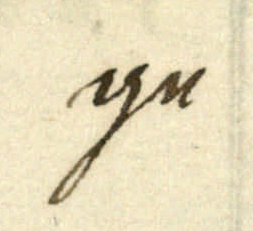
ge
